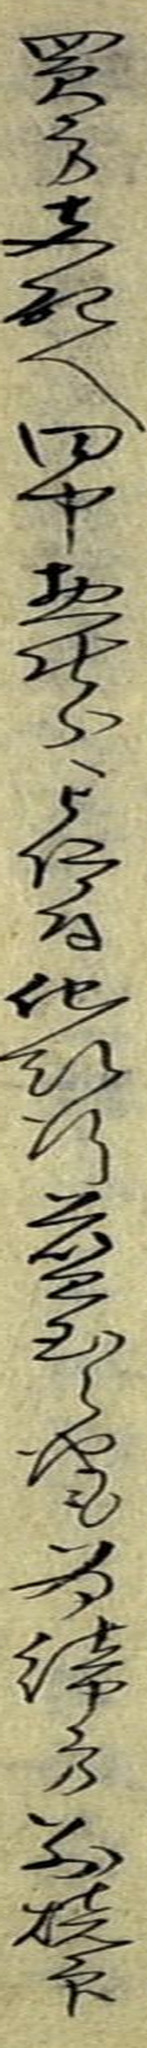買方支配人田中惣次郎へ被仰付他領行藍玉之儀も為締方別焼印
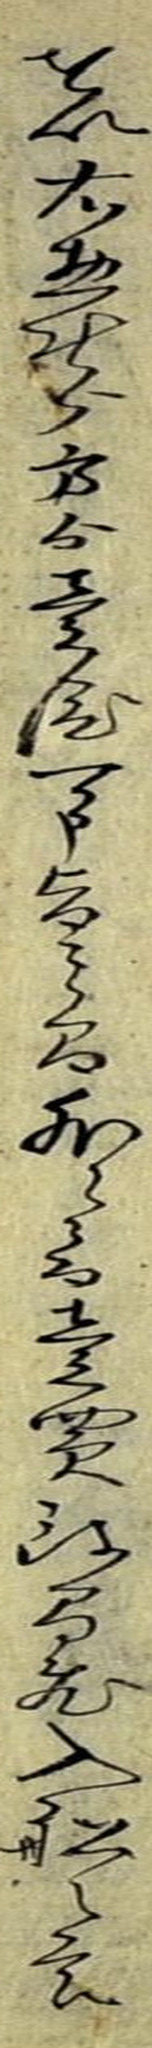を以右惣次郎方ゟ売渡可申旨に候間外々に而売買致間敷入船之節
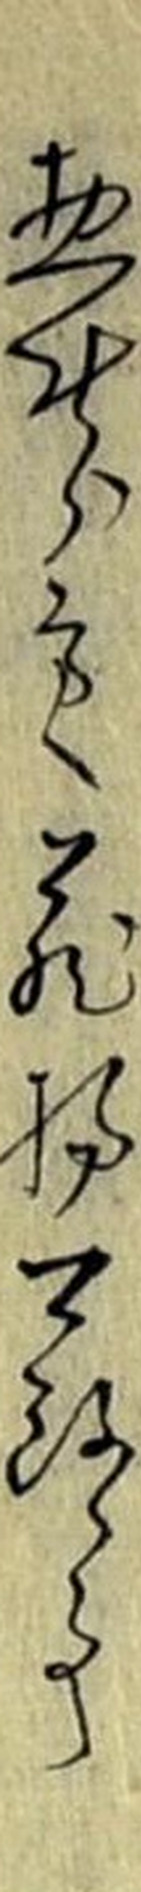惣次郎方へ蔵上可致候事
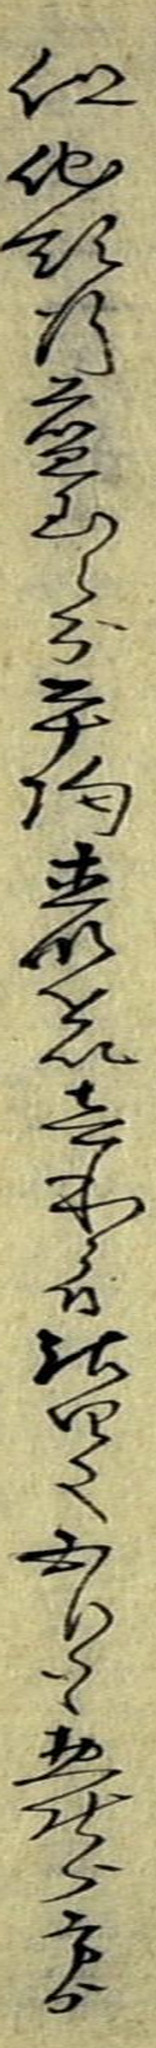但他領行藍玉之分平均直段を以壱本に付銀四匁五分つゝ惣次郎方ゟ
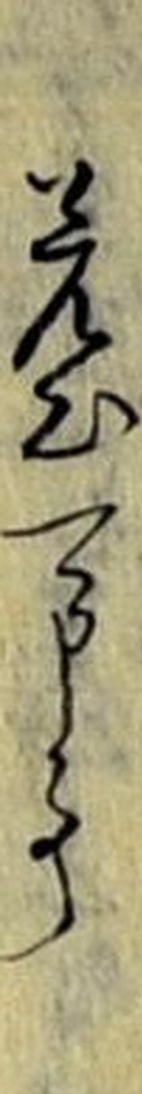差出可申事
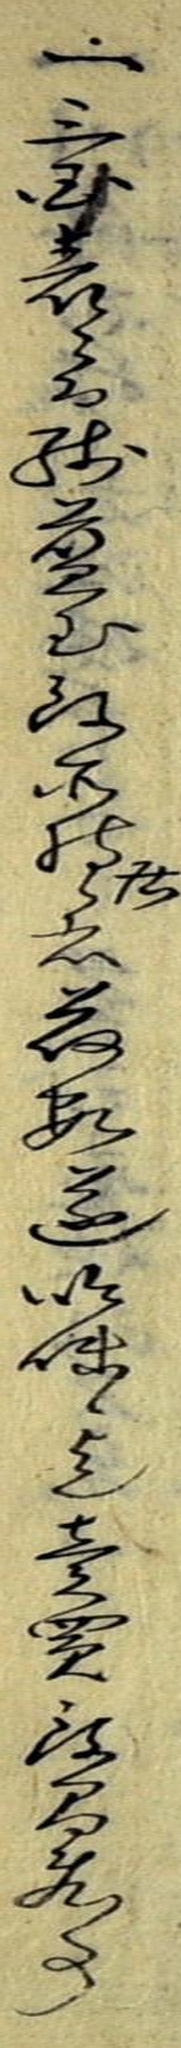一三国表に而残藍玉致所持居候者荷数遂吟味候迄売買致間敷事

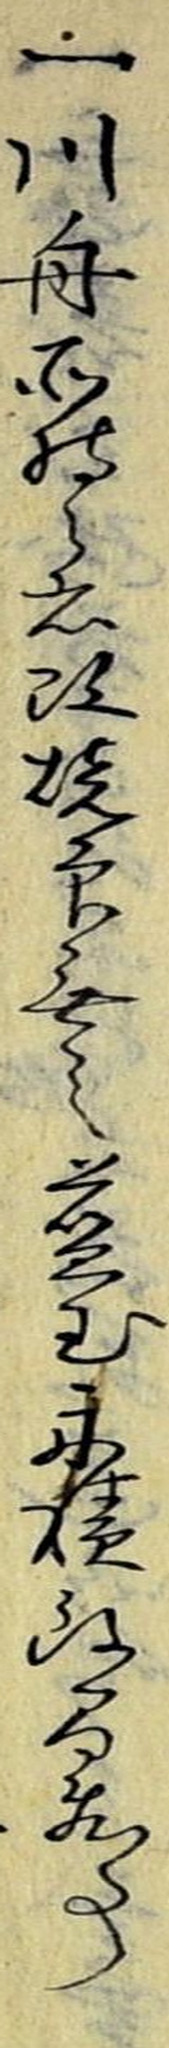一川舟所持之者改焼印無之藍玉舟積致敷事
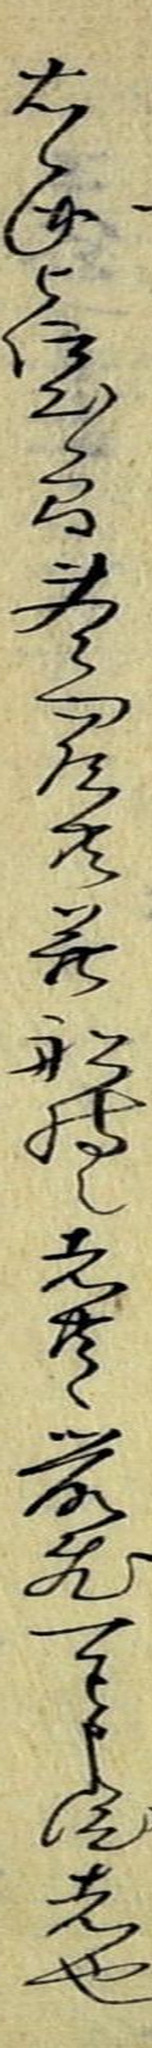右之趣被仰出候間夫々問屋共井船持之者共へ厳敷可被申渡者也
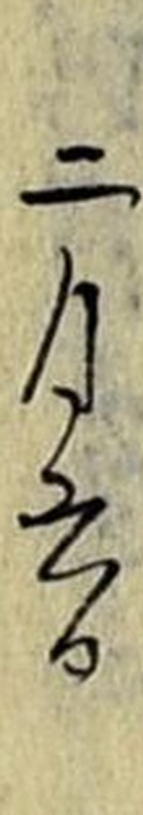二月六日
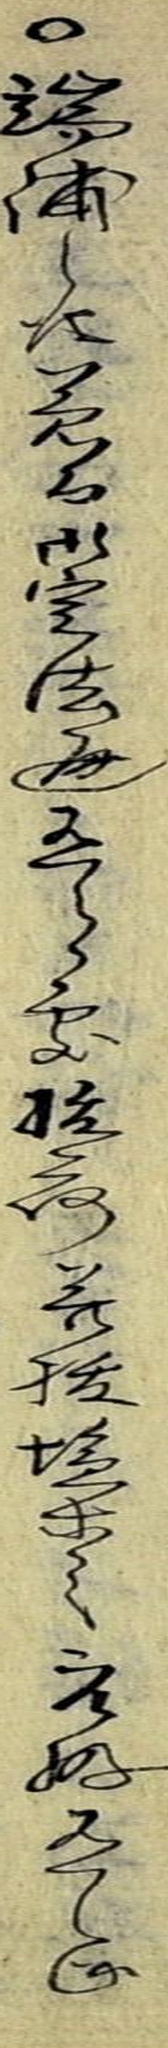○端浦之儀兼而御定法通有之候処抜荷井抜塩等之取扱有之趣
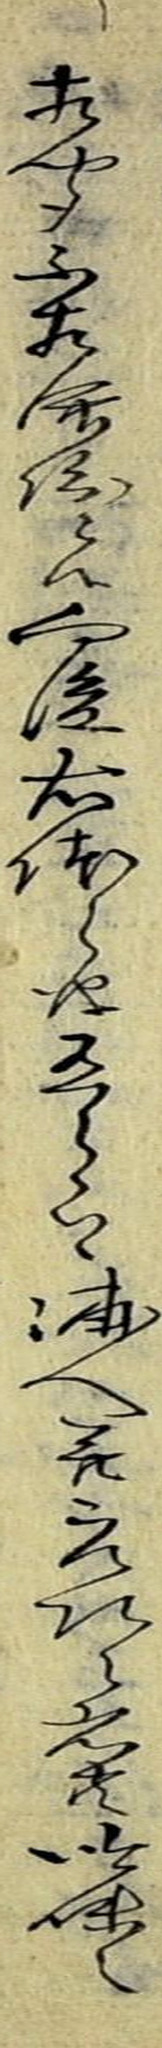相聞不相済儀に候向後右体之儀有之候はヽ浦人井取次之者共吟味之
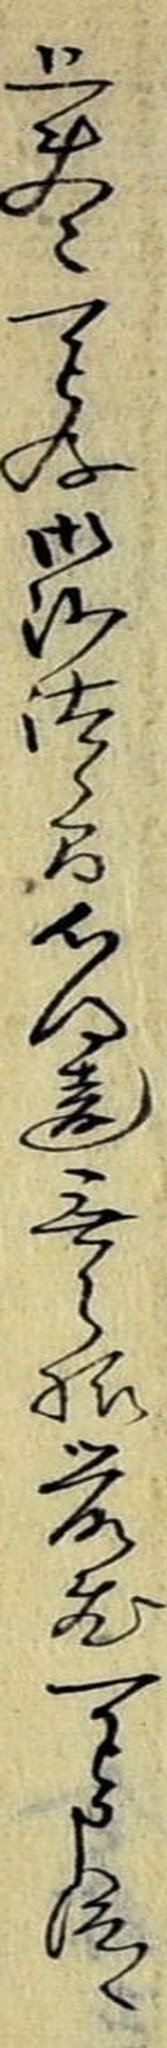上夫々可被及御沙汰候間心得違無之様厳敷可被申渡候
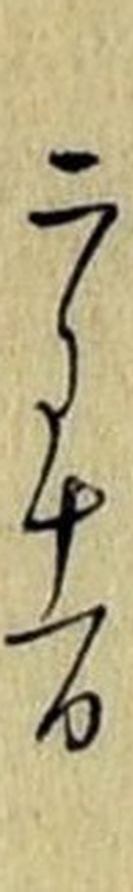二月十一日
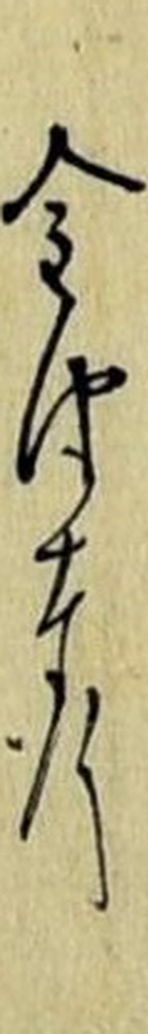金津奉行
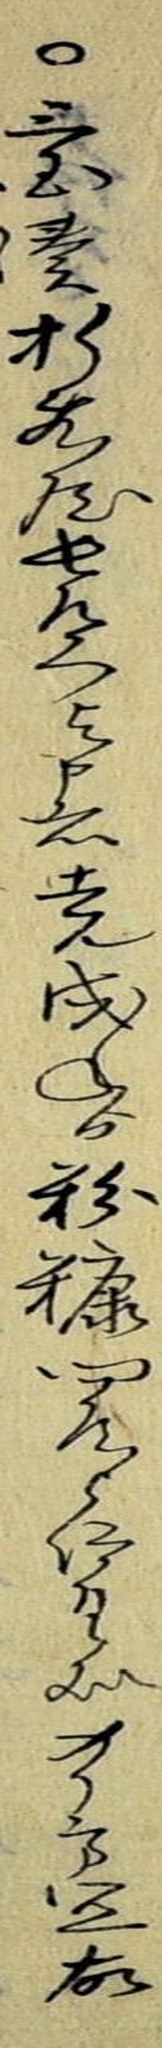○三国湊折敷屋長左衛門と申者去ル戌年ゟ粉糠問屋被仰付候処〆り方宜故
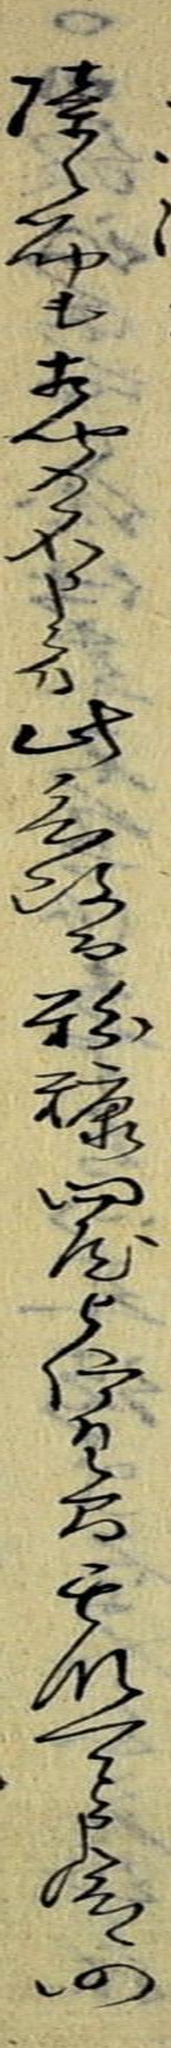障之筋も相聞不申候に付此度改而粉糠問屋被仰付候間其段可被申渡候仍
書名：命令之部 四
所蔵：福井県文書館 Fukui Prefectural Archives
